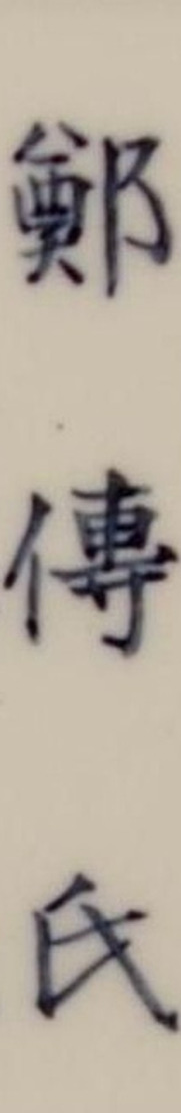鄭傳氏
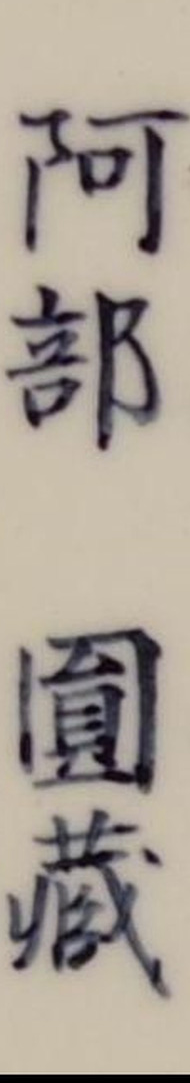阿部円蔵
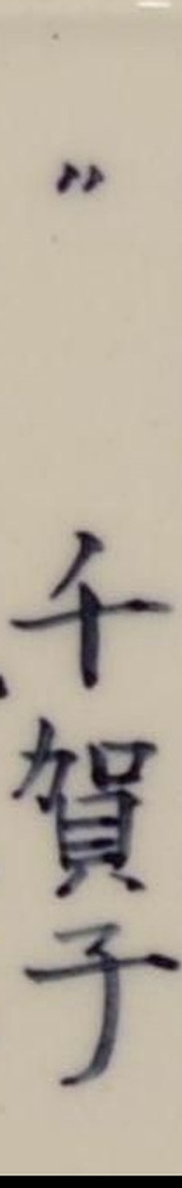千賀子
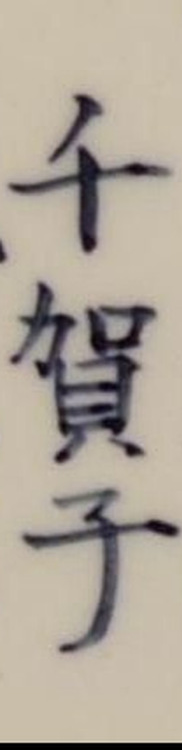千賀子
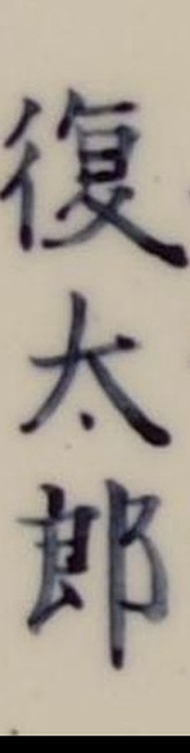復太郎
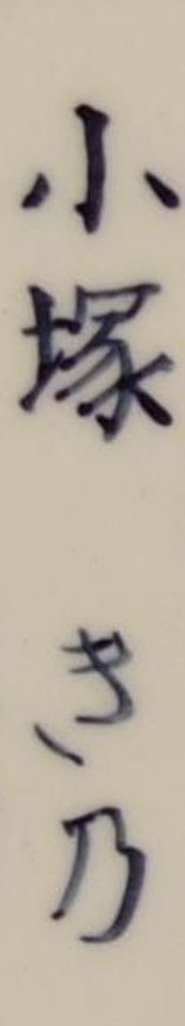小塚きの
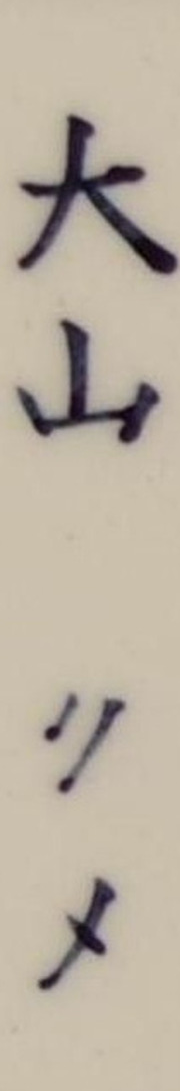大山クメ
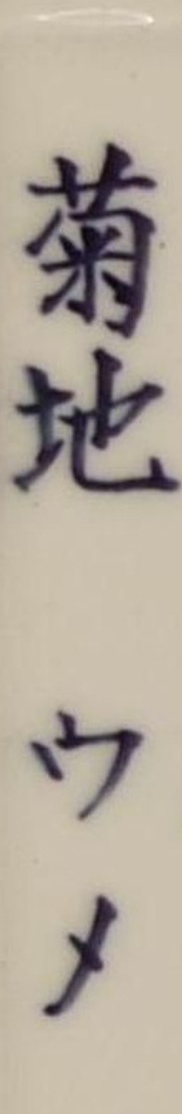菊地ウメ

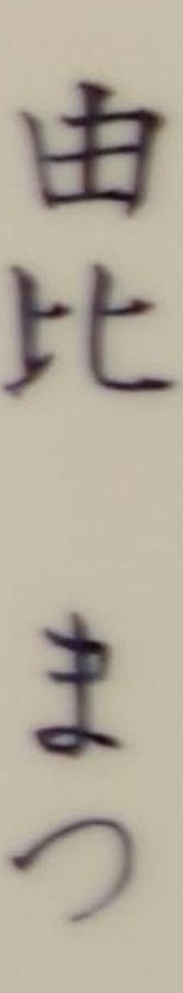由比まつ
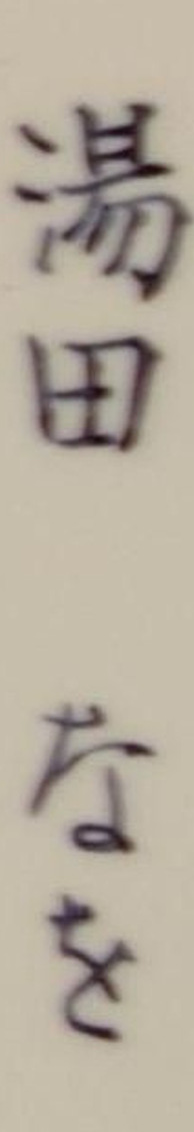湯田なを
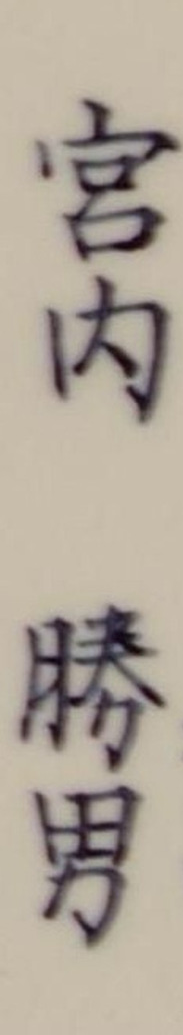宮内勝男
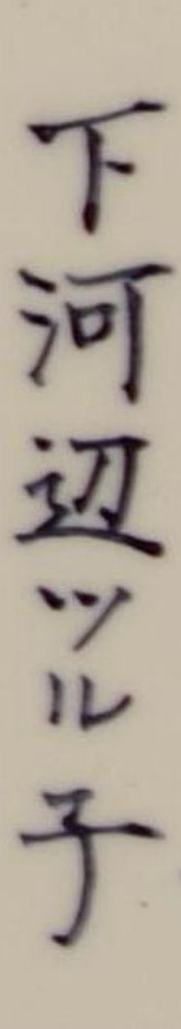下河辺ツル子
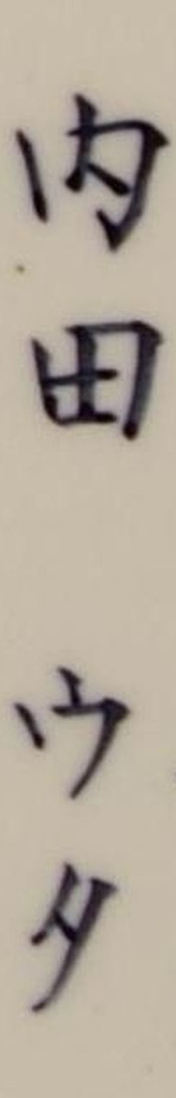内田ウタ
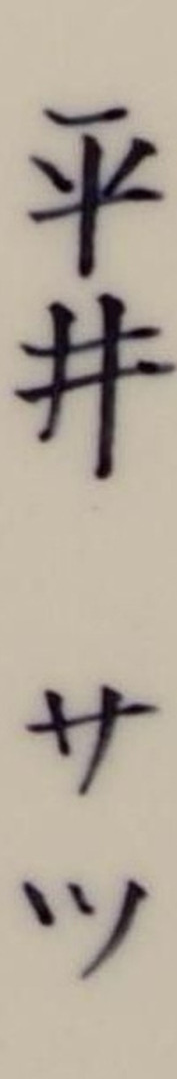平井サツ
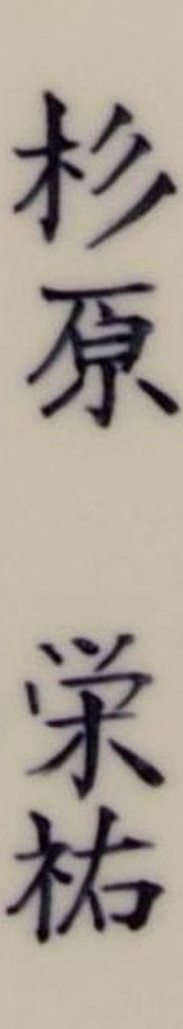杉原栄枯
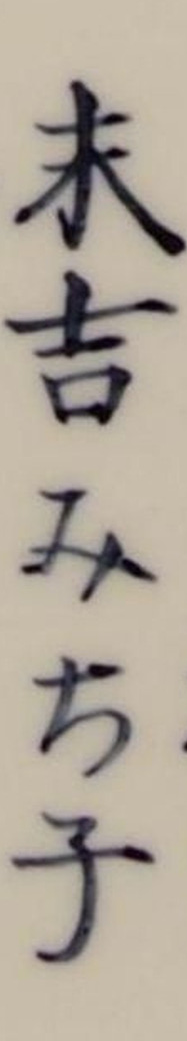未吉みち子
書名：M~S
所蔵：高野山金剛峯寺
